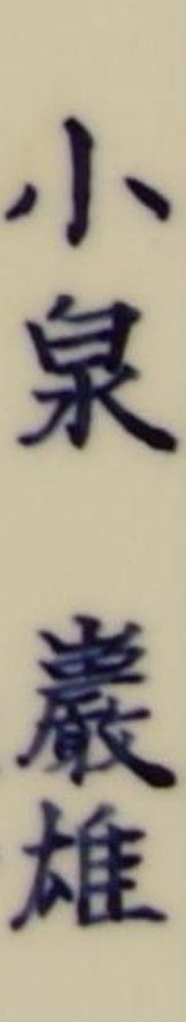小泉巌雄
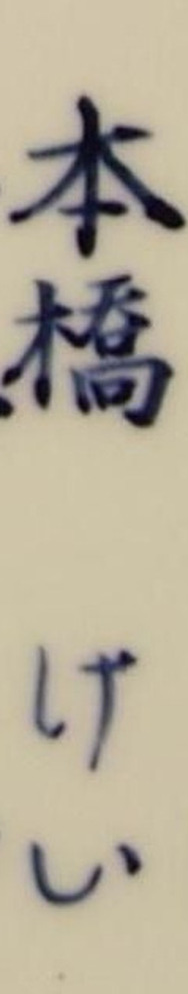本橋けい
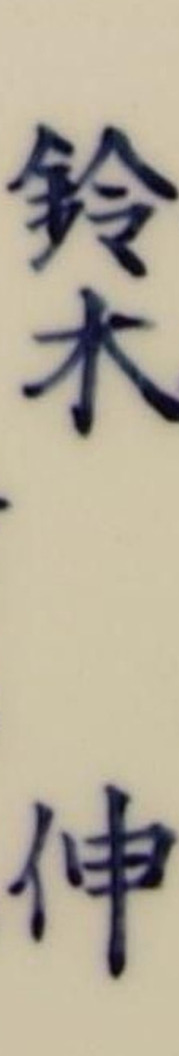鈴木伸
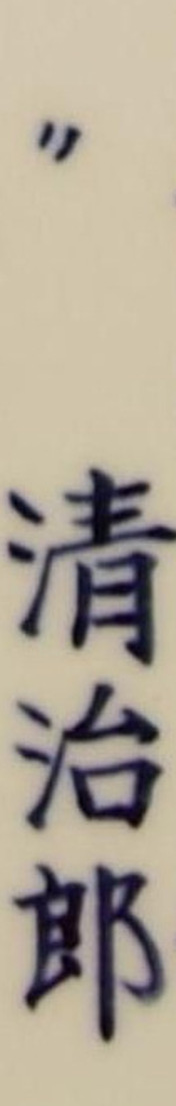清治郎
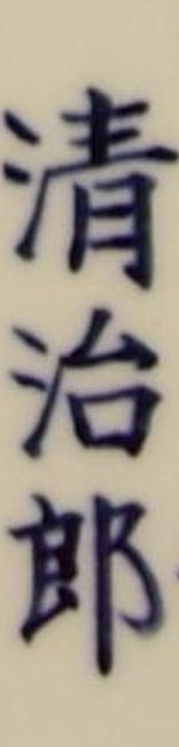清治郎
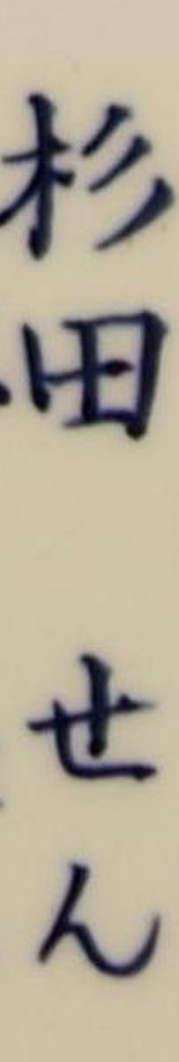杉田せん
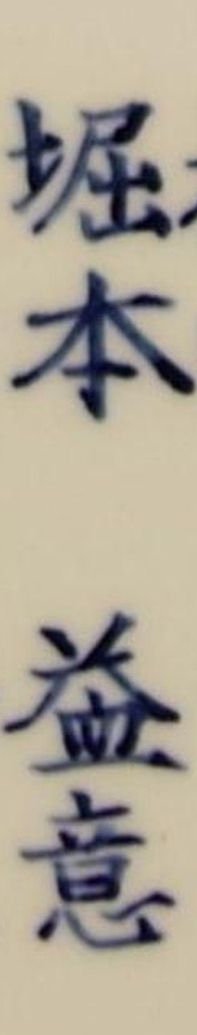堀本益意
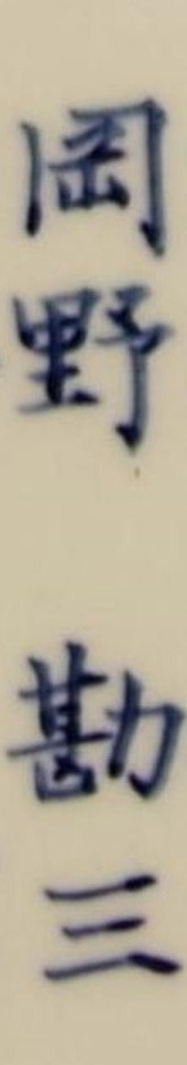岡野勘三
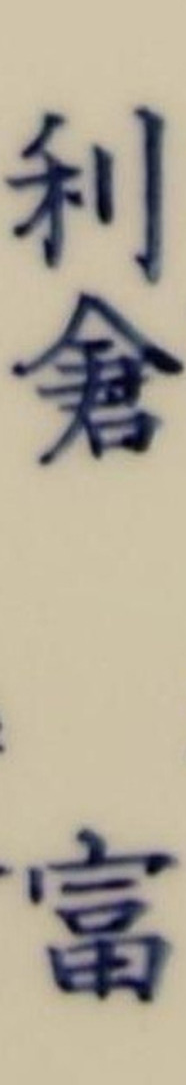利倉富
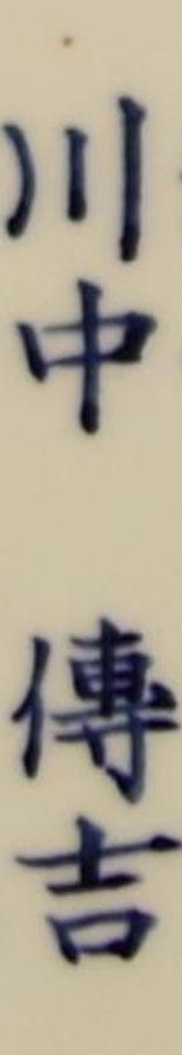川中伝吉
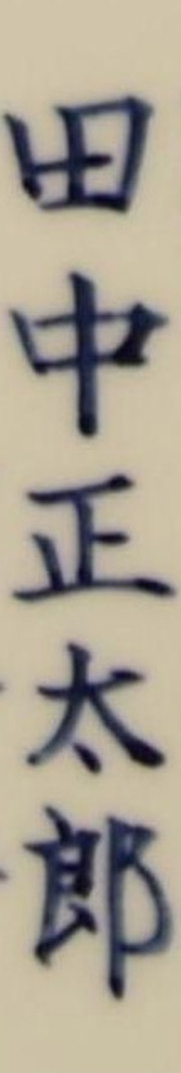田中正太郎
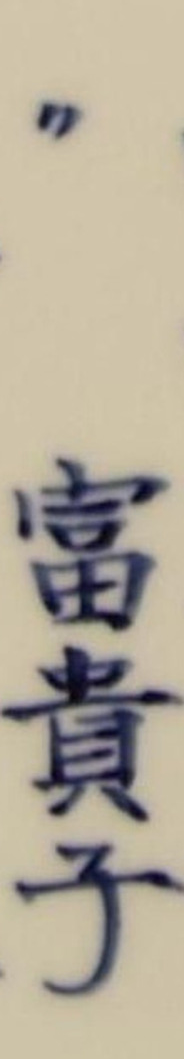富貴子
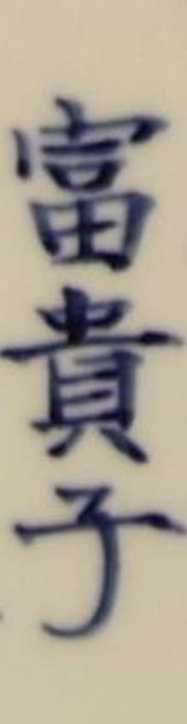富貴子
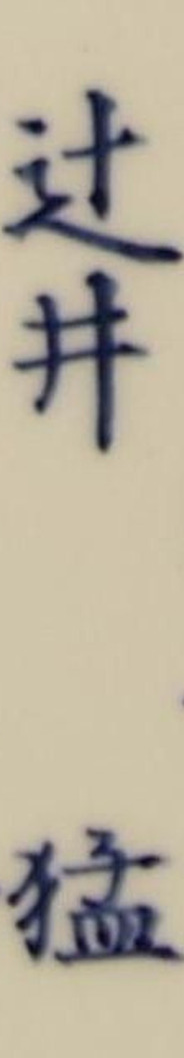辻井猛
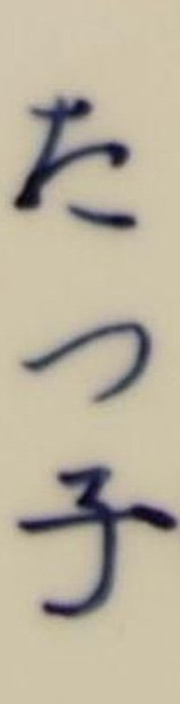たつ子
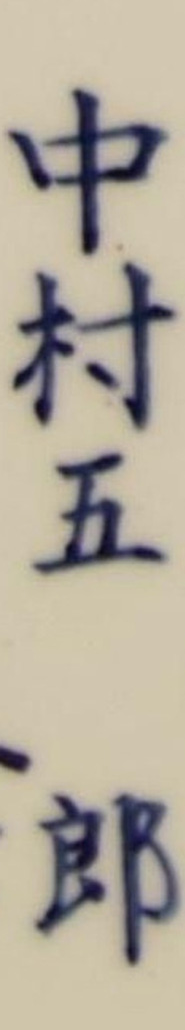中村五郎
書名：A~D
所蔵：koyasan kongobuji
